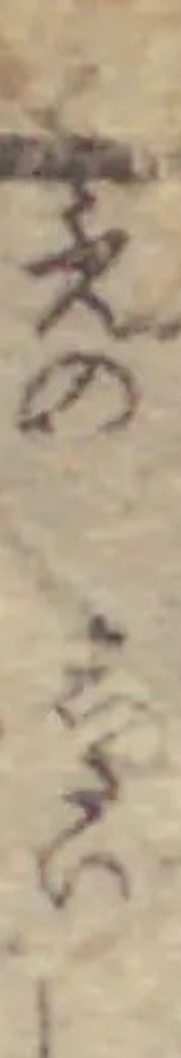ふんの
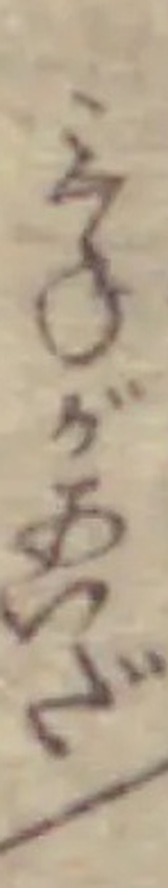三年があいだ
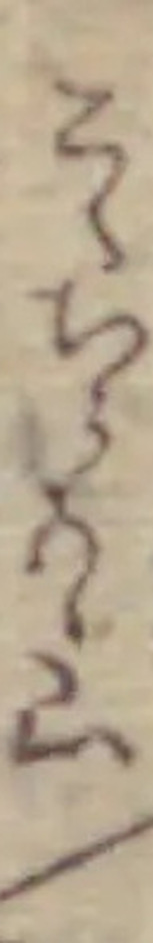こくちうもゝ山
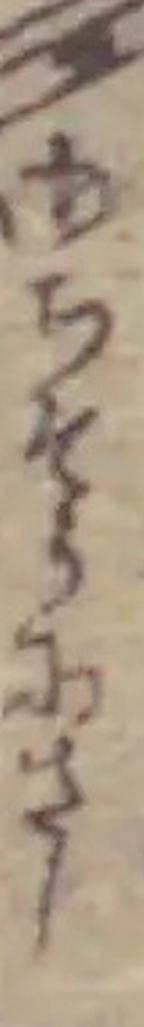御ちそうにさし
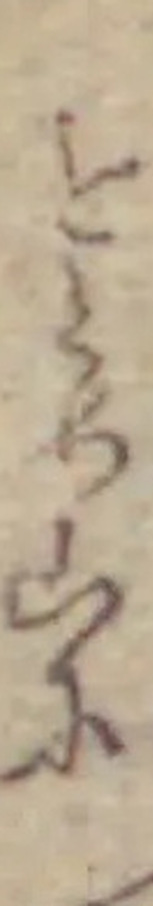をとめ山に
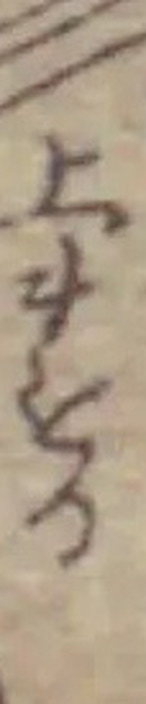上まする
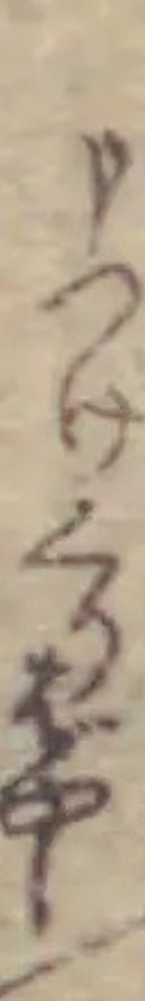申つけくりばやし
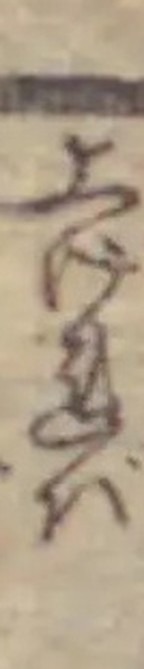上ければ
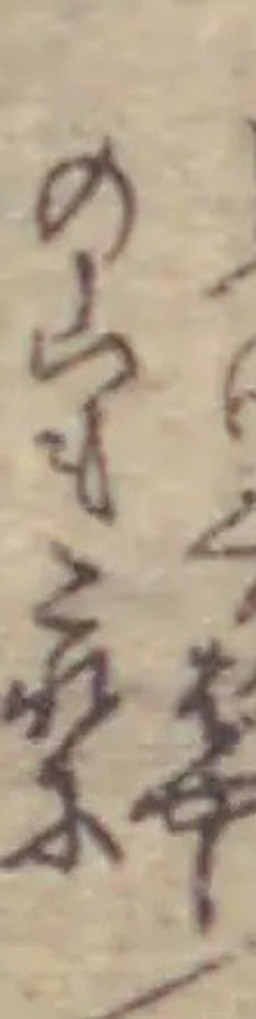の山もこれに
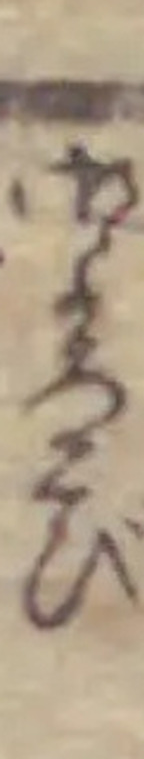御よろこび
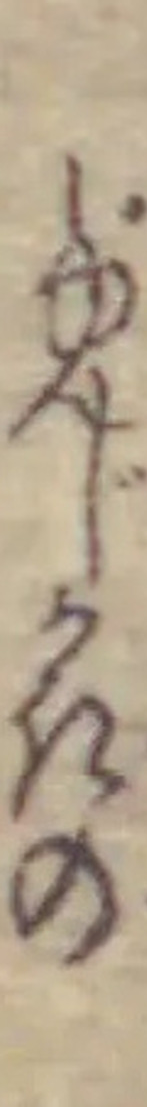じゆんじかきの
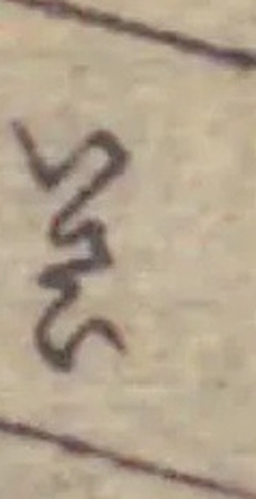いさい
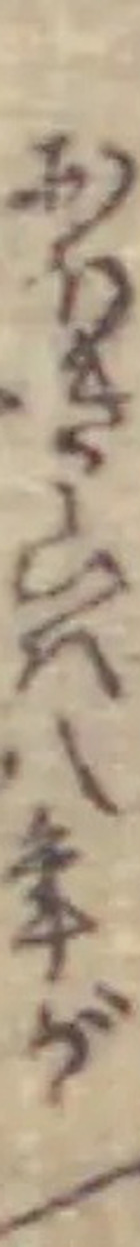おほき山は八年が
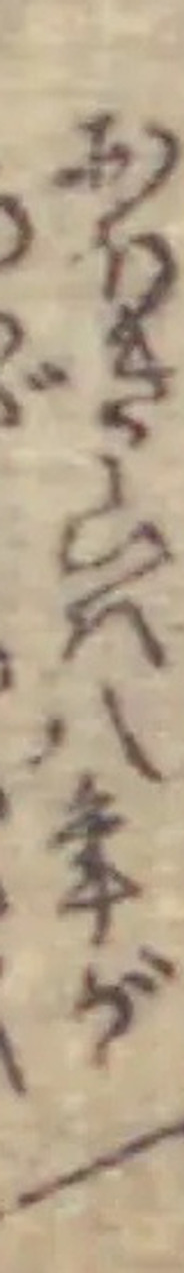おほき山は八年が
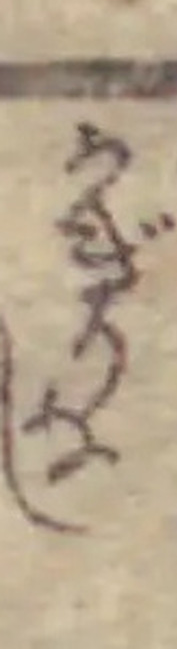かぎりなし
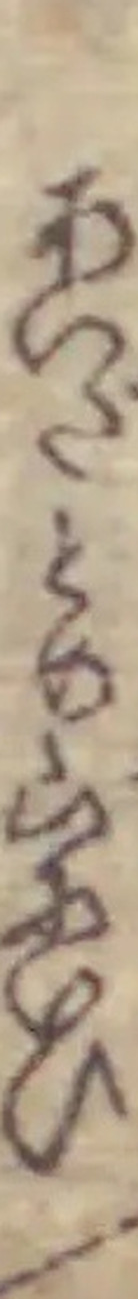あいだとめ山にいひ
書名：奥州咄 3巻
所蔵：国立国会図書館 National Diet Library, JAPAN
